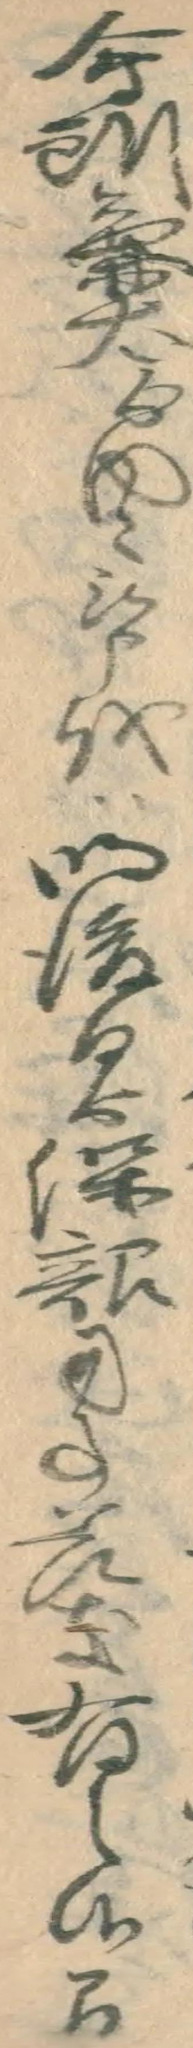会所兼太ゟ内々被申越ハ明後日ゟ保韶用事差支有之候間

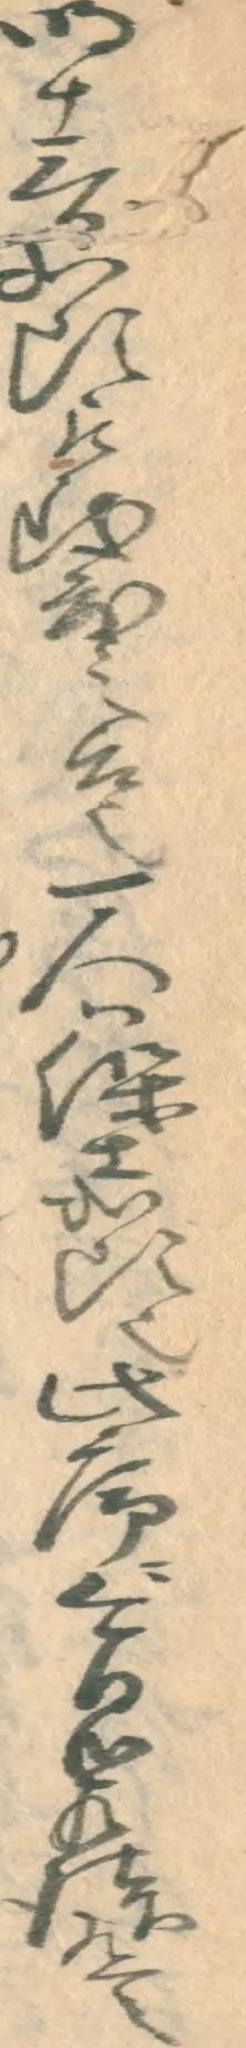明十三日出頭被致度之旨也一人ハ保土出頭也此序ニ今日御相談有之
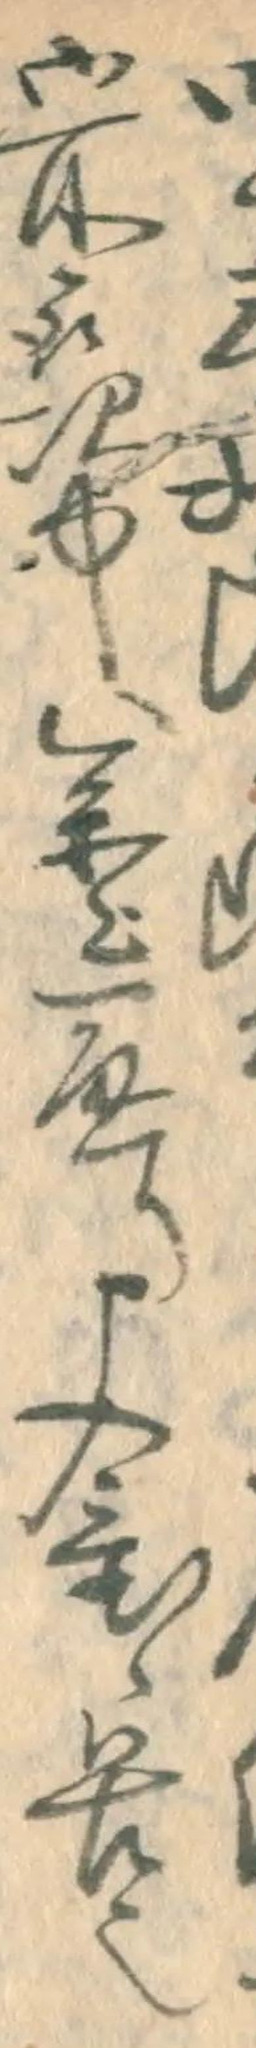御所取次中へ参上一通リ申入置候筈也
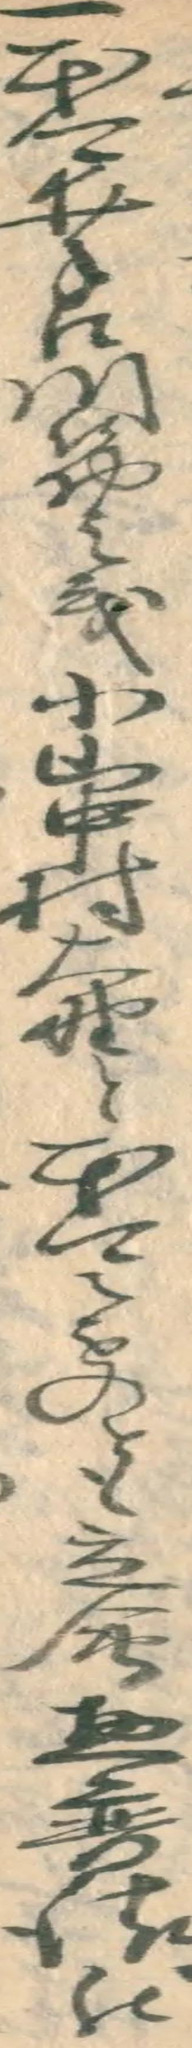一本郷井手口川筋之義小山中村大野と本郷之ものとも立会惣普請ニ仕
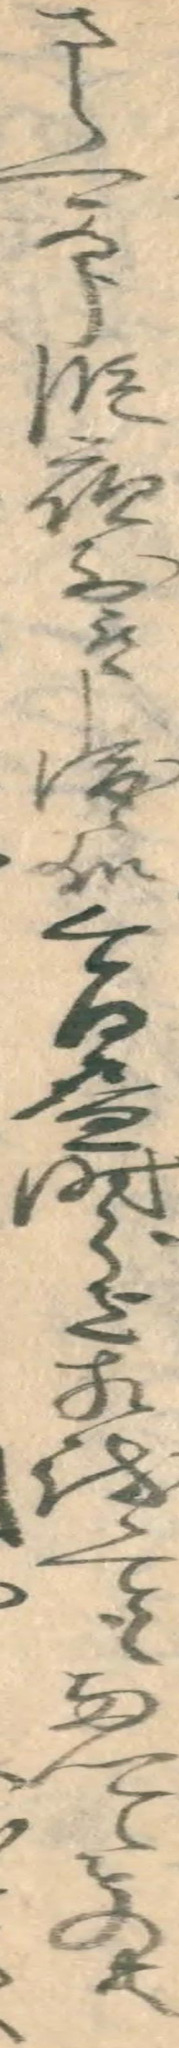さらへ為申段夜前被申渡候処今日昼時分迄相待候へとも両郷之もの共
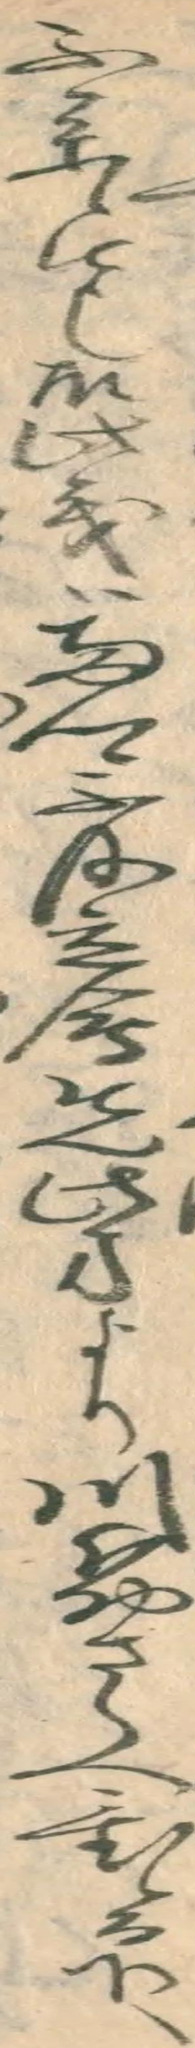不参候由申候故此義ハ両郷不及立会先此方より川筋さらへ置候而下へ
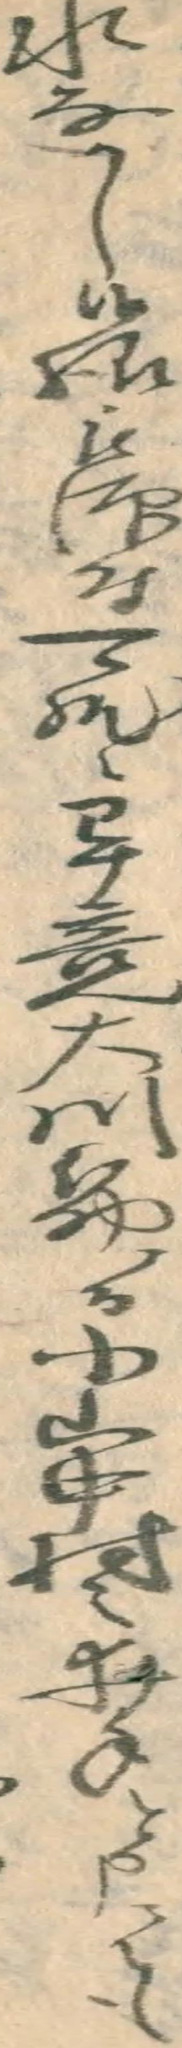水なかし候様被仰付可然候畢竟大川筋ニ而小山中村之井手と申ニても
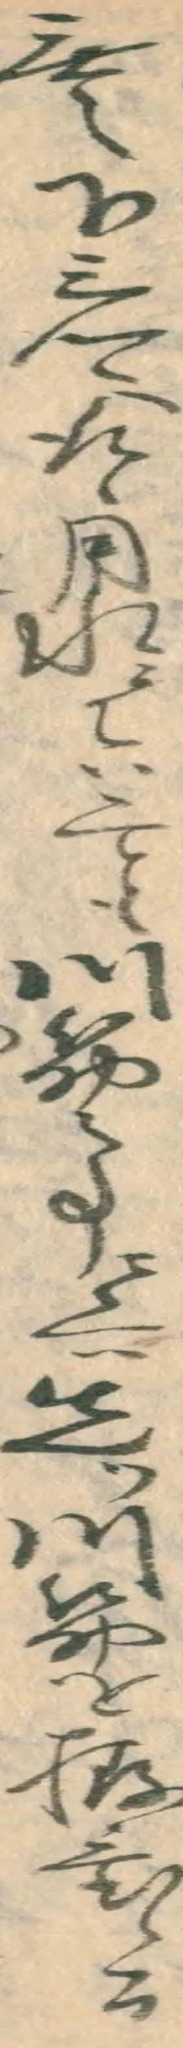無之下三郷へ取候用水ニてハ候へとも川筋之事ニ候へハ先ツ川筋を拵置候而
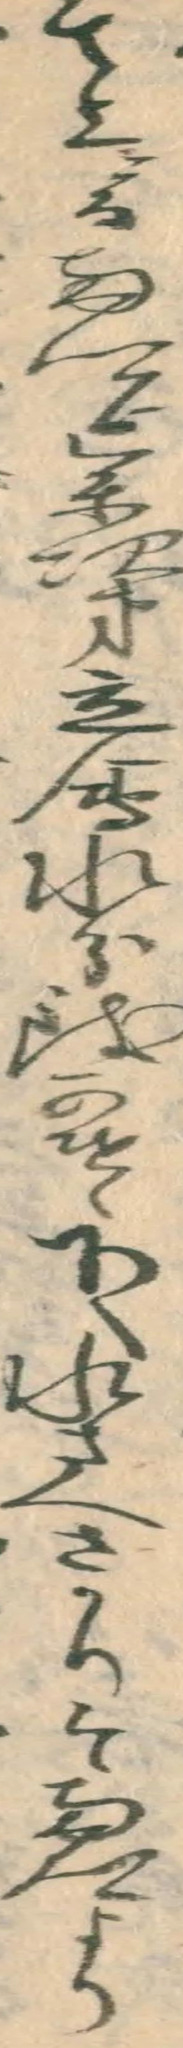其上ニ而両郷ゟ参次第立会水分致可遣候下へ水さへさかり候ハヽ両郷より
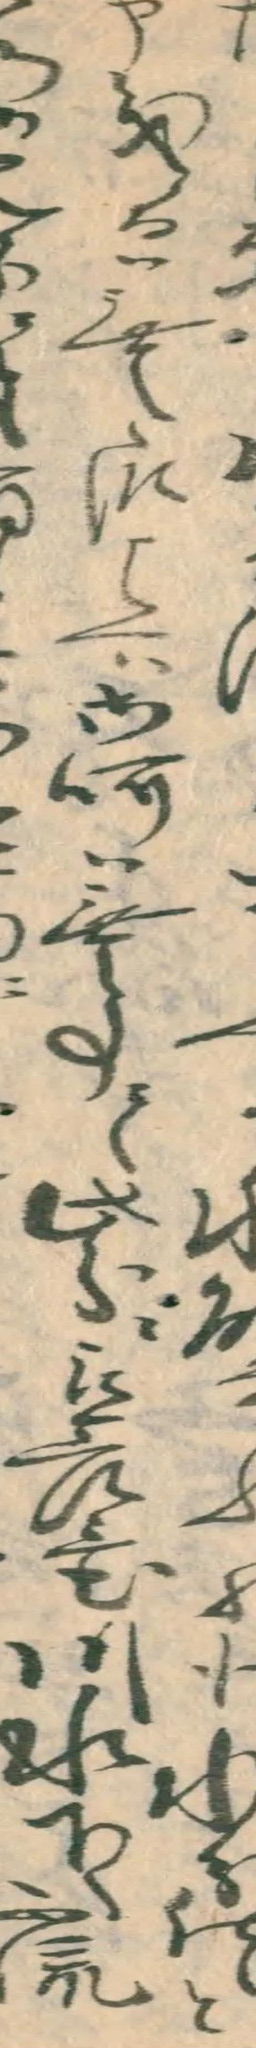申義ニ而ハ無之候段申候へハ御呵ハ無事ニ候此分ニ被差置川水下へ不流
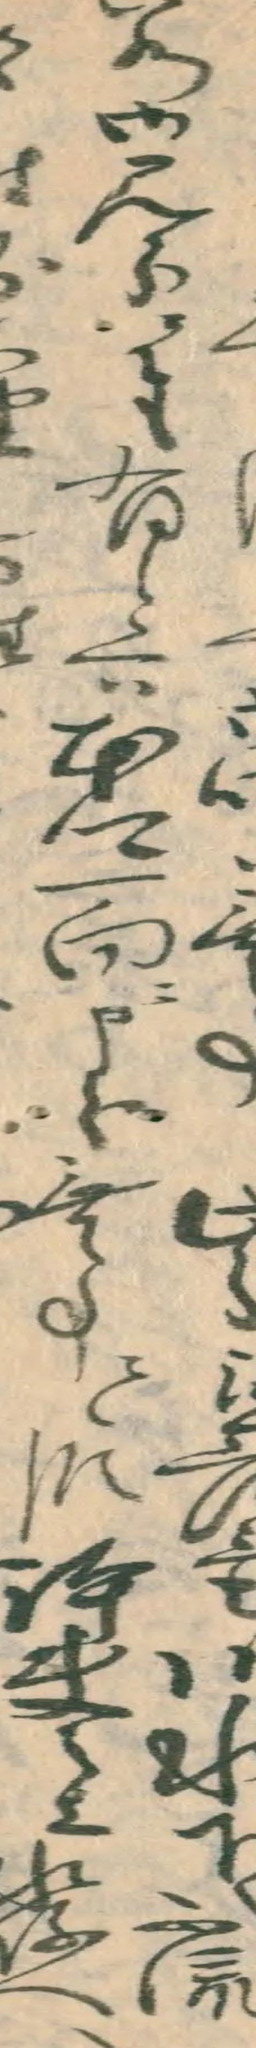若御見分ニても有之候へハ本郷一向ニ申分無事ニ候故評決之上水役人へ
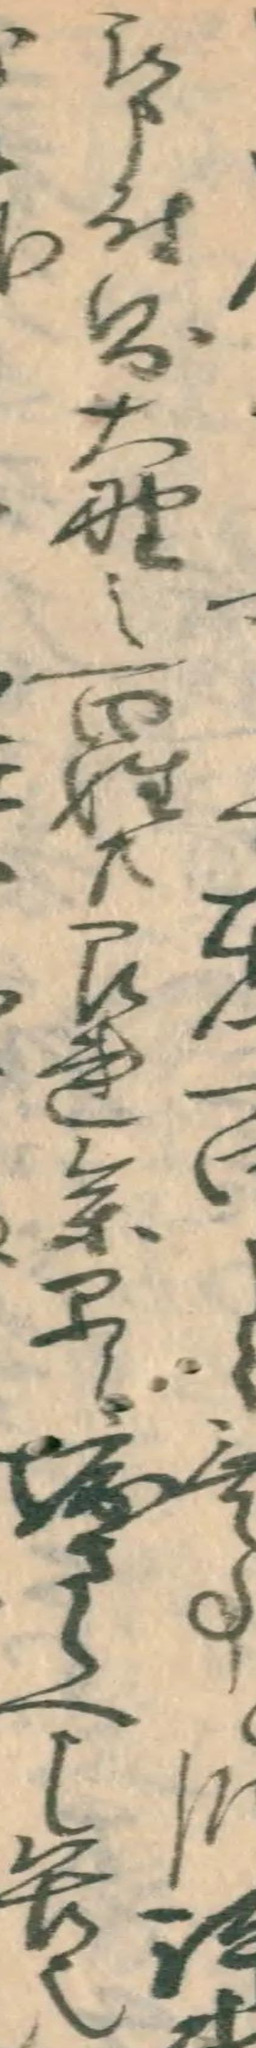被申付則大野之百姓共召連参早々ニ堀さらへ申候筈也
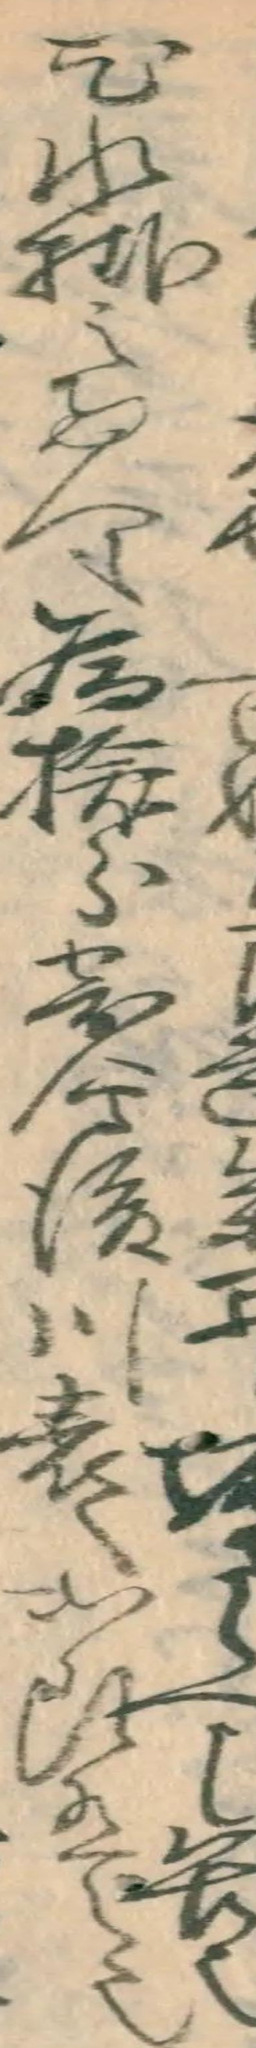尤水掛之両人も為検分寄会後川表へ出頭有之也
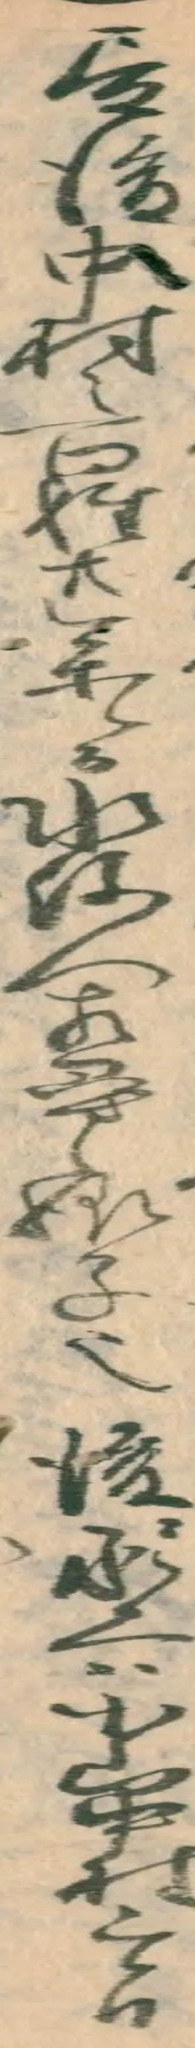一昼後中村之百姓共参候而水役人相尋候様子也後ニ承候へハ小山中村今日
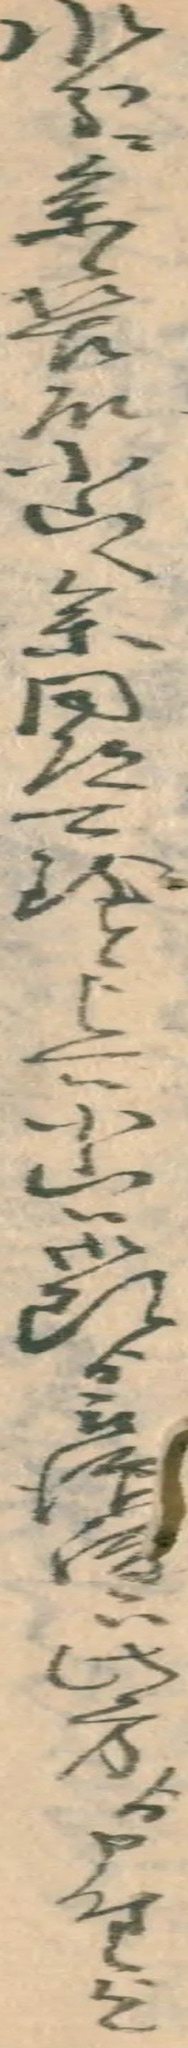水分ニ参候筈故小山へ参同道可致と申候へハ小山ハ御頭ゟ被仰渡候ハ此方ゟ申付候迄
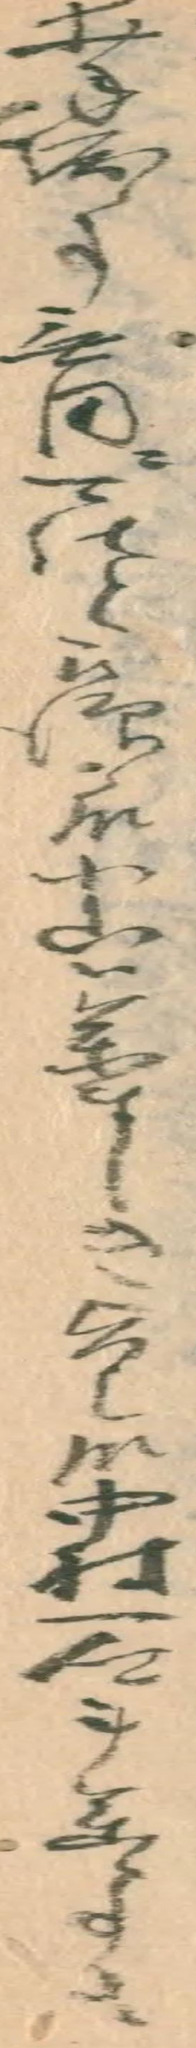井手堀候事無用ニ可仕と被仰候故小山ハ参ましき旨申候故中村一郷計参候事者
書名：賀茂社記録. 第58冊
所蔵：国立国会図書館 National Diet Library, JAPAN
